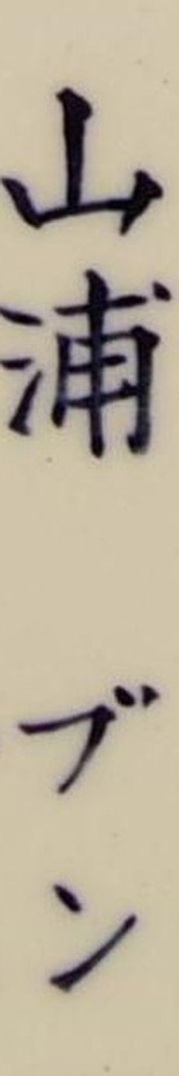山浦ブン
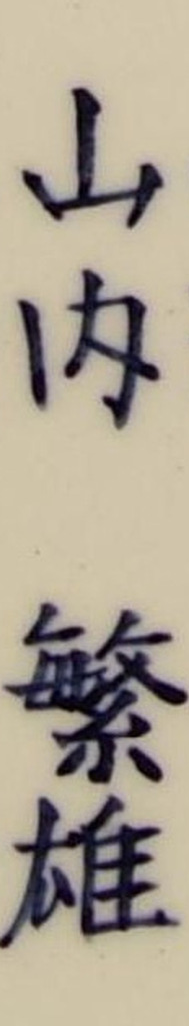山内繁雄
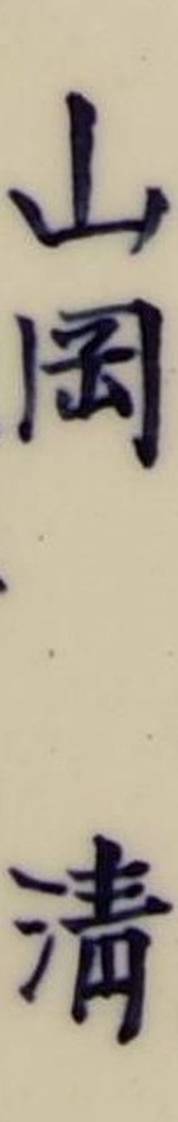山岡清
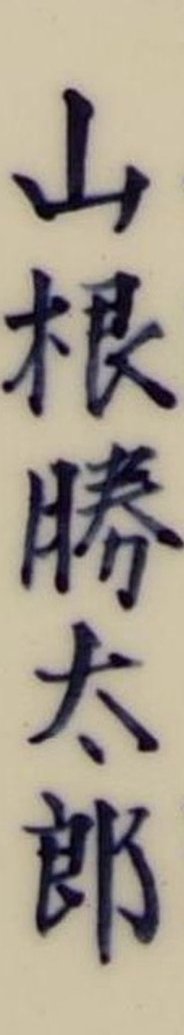山根勝太郎
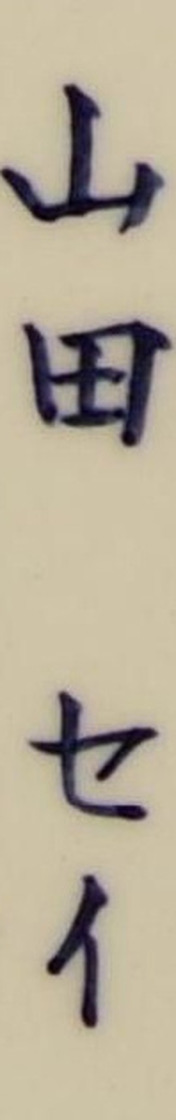山田セイ
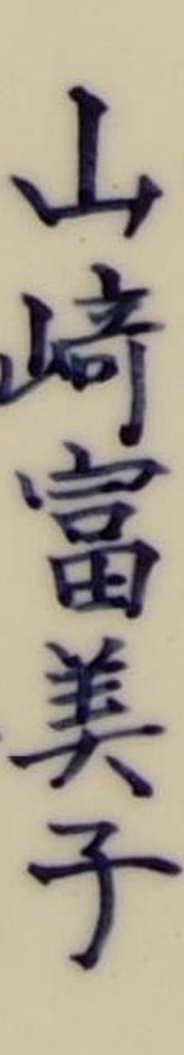山崎富美子
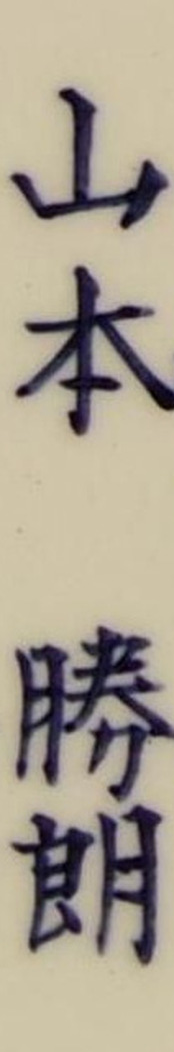山本勝朗
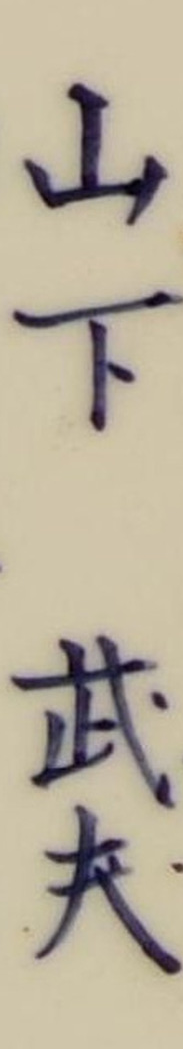山下武夫
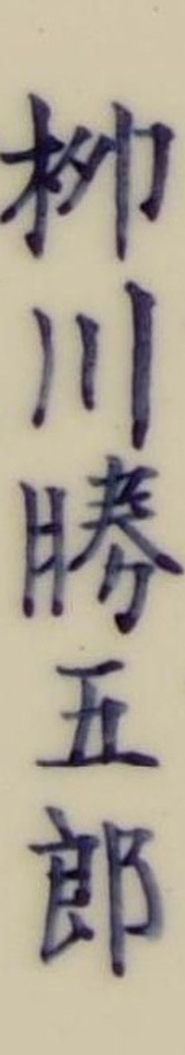柳川勝五郎
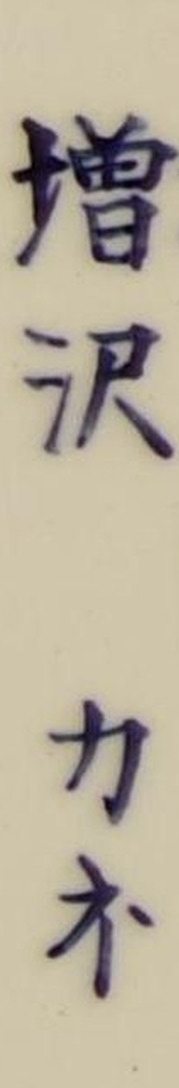増沢カネ

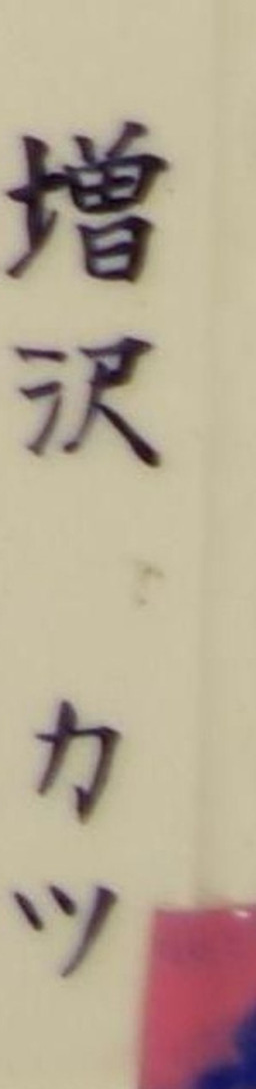増沢カツ
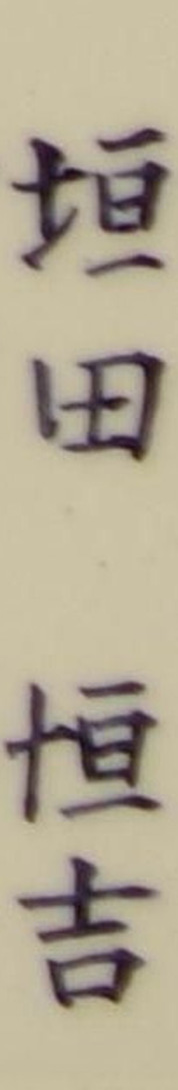垣田恒吉
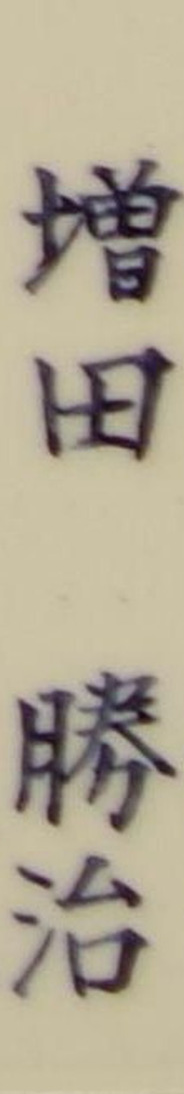増田勝治
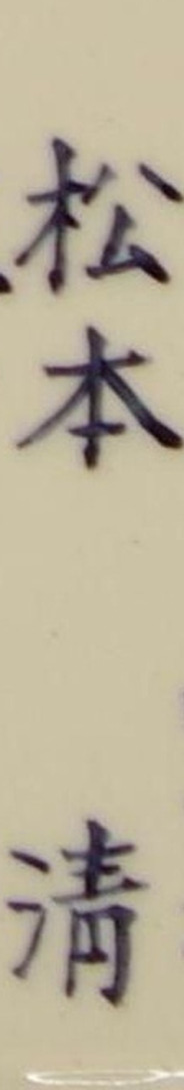松本清
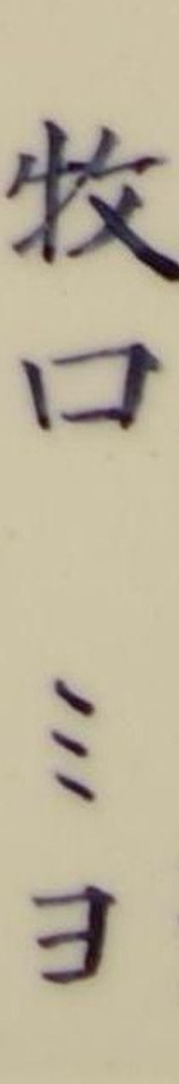牧口ミヨ
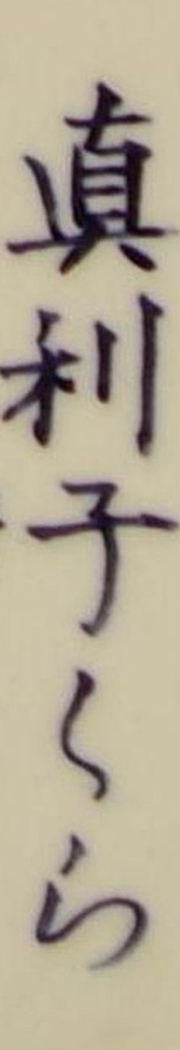真利子くら
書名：E~L
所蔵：高野山金剛峯寺
